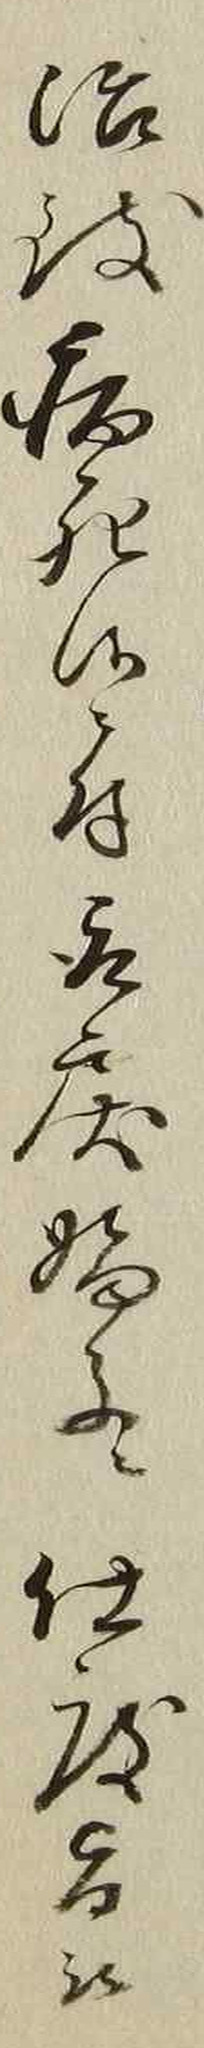治致病死候ニ付取戻嫡子ニ仕度旨被
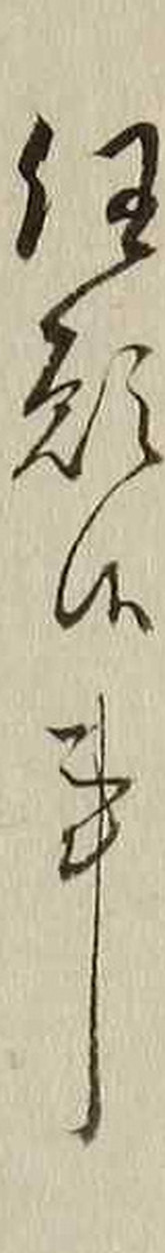任願候事
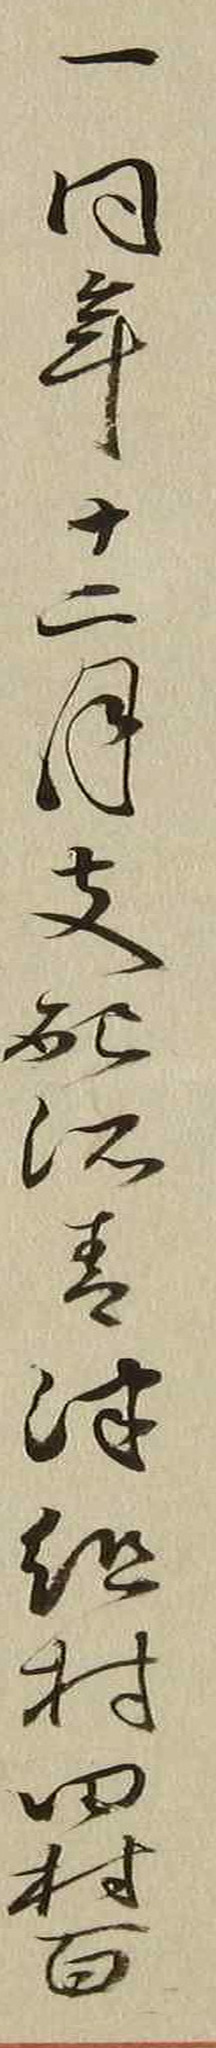一同年十二月支配所青津組村田村百
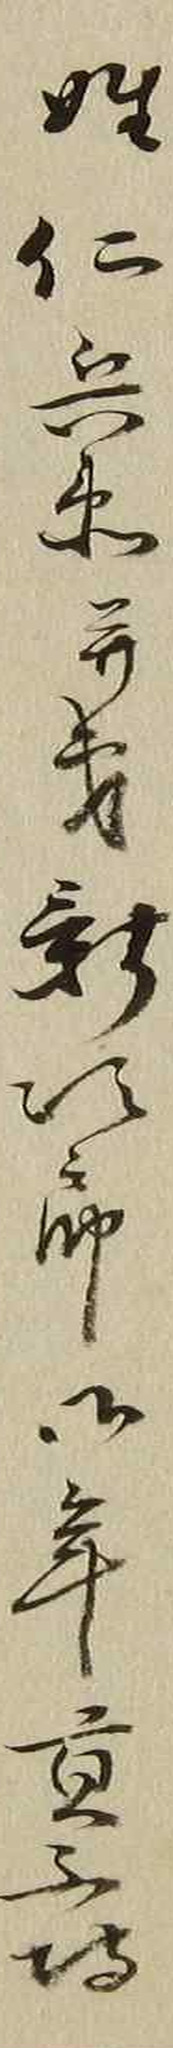姓仁兵衛幷弟新次郎御年貢不埒
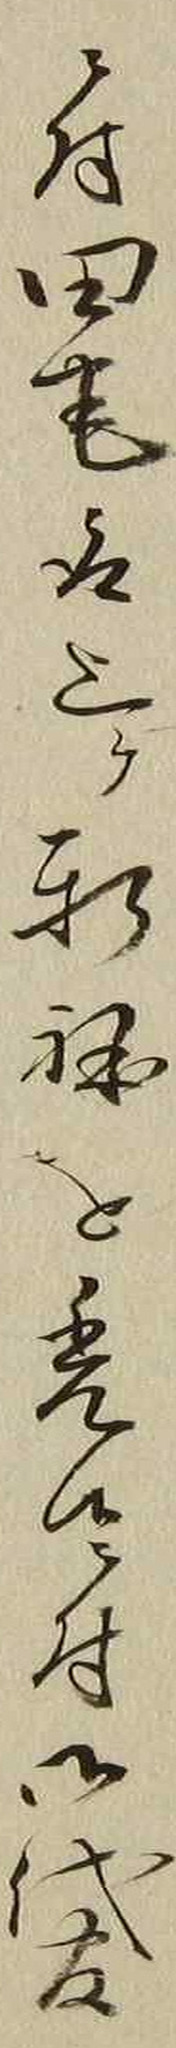ニ付田宅取上ヶ斬禄を禿候ニ付御代官
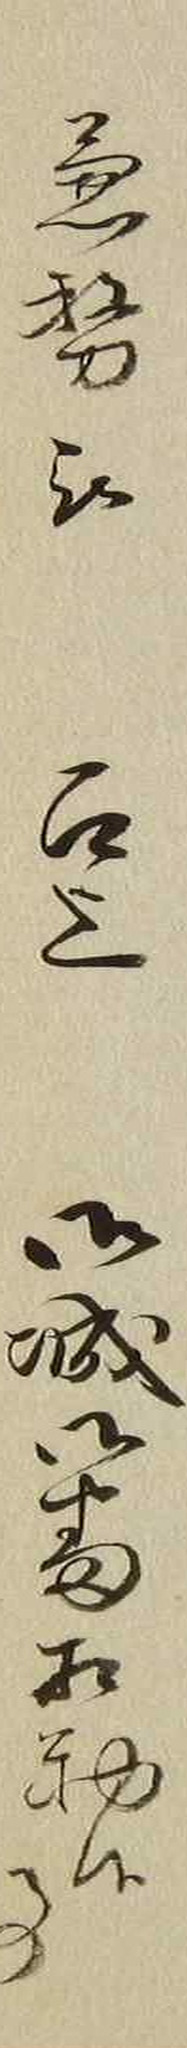兼務被召上御城御番相勤候事
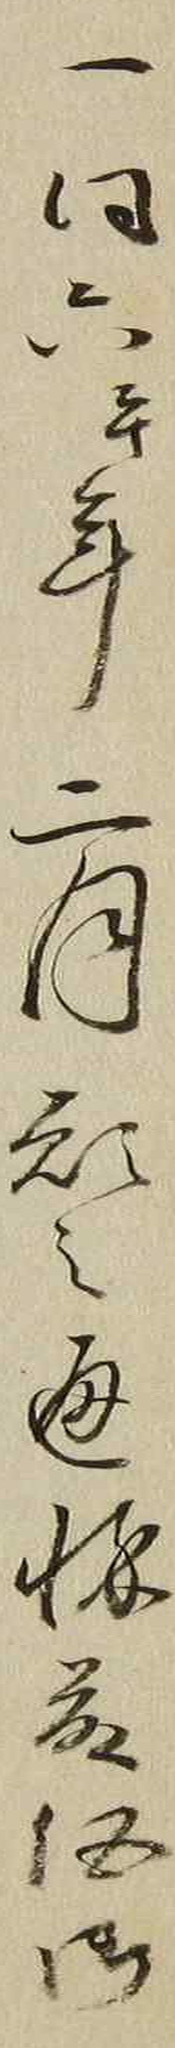一同六午年二月願之通忰藤伍御
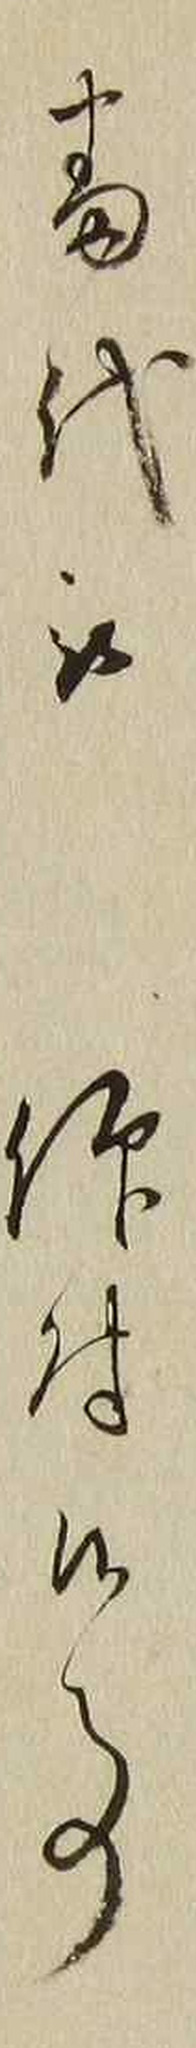番代被仰付候事
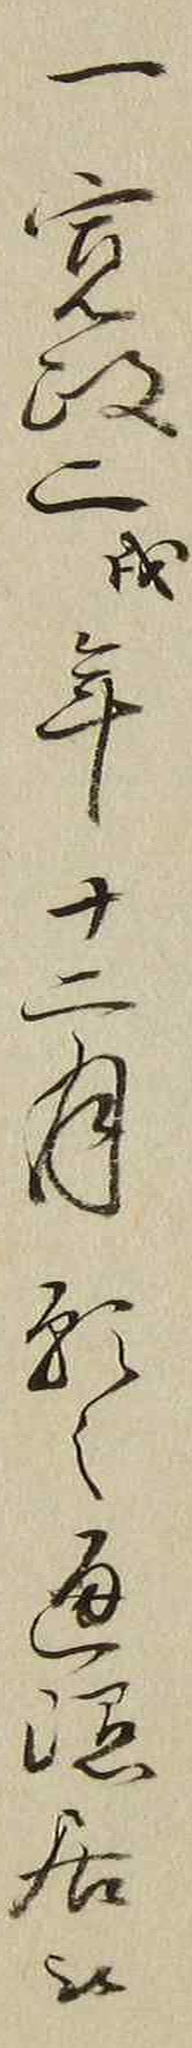一寛政二戌年十二月願之通隠居被
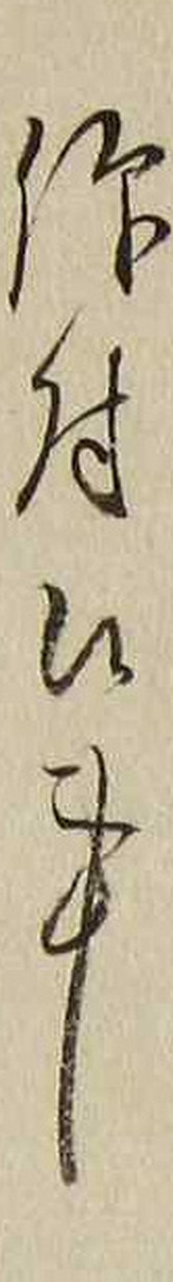仰付候事
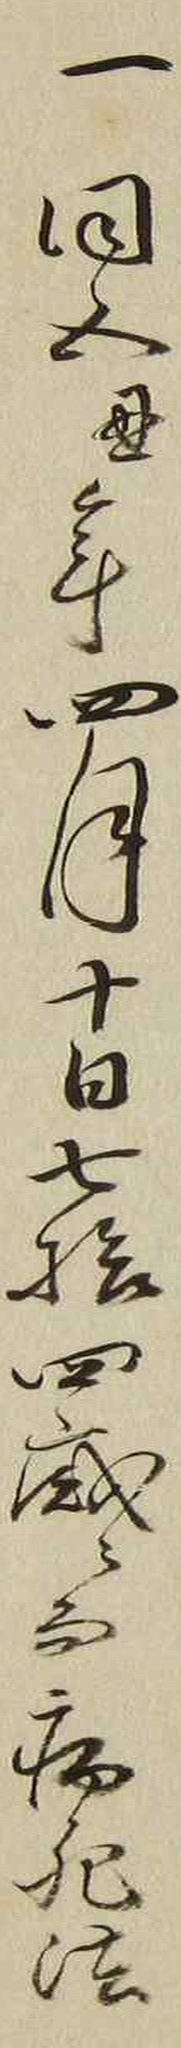一同五丑年四月十日七拾四歳ニ而病死法
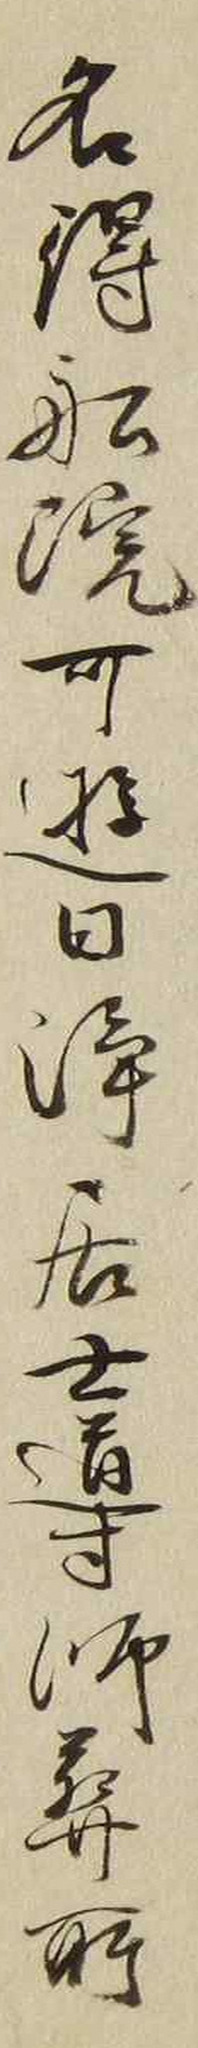名得船院可進日浄居士導師葬所

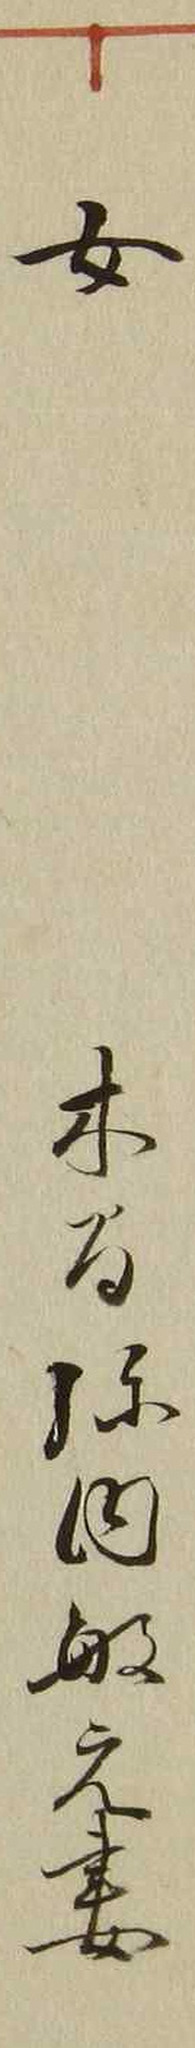女木間弥内敏元妻
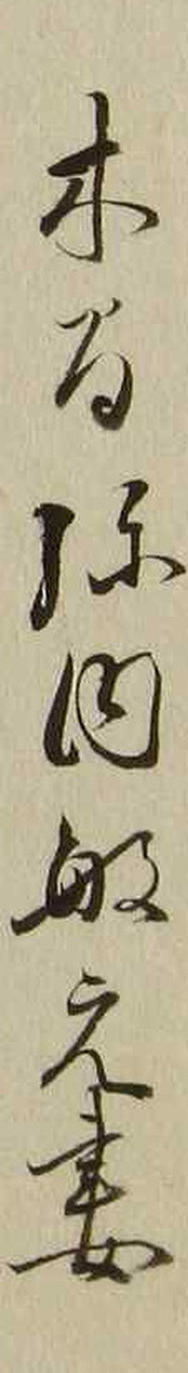女木間弥内敏元妻
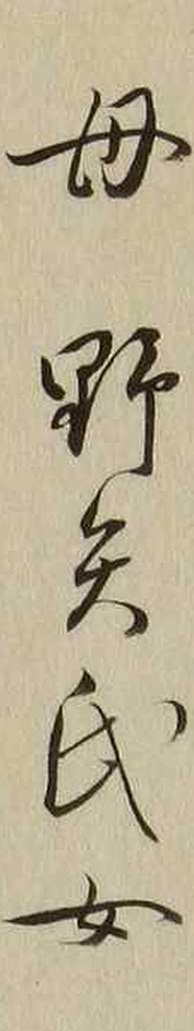母野矢氏女
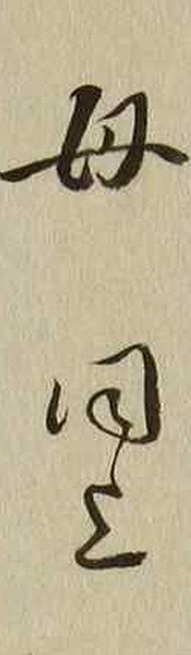母同上
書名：諸士系譜　巻之52　に之部3
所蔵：会津若松市立会津図書館
